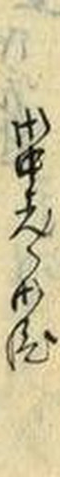御内御直書御中老へ御渡
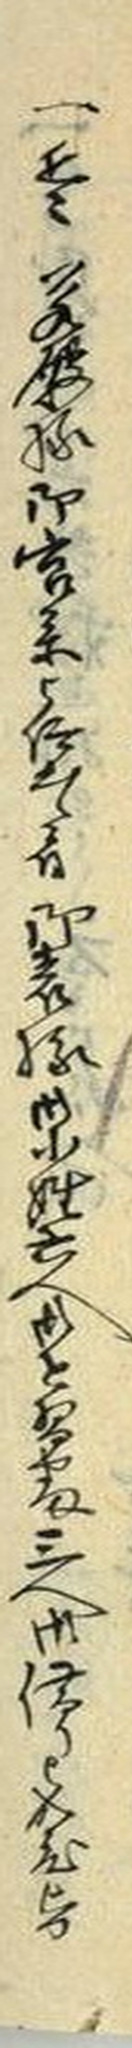一近々若殿様御宮参被仰出候ニ付御表様御小姓六人御近習番三人御借り被成度旨
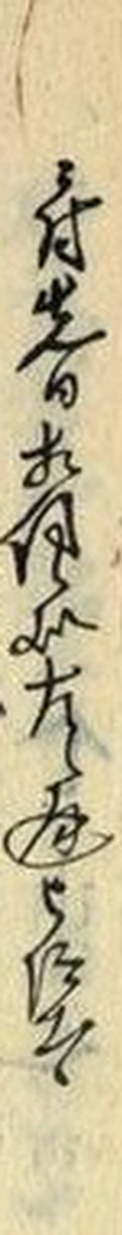ニ付先日相伺候処左之通被仰出候
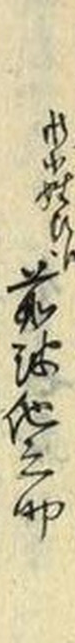御小姓頭取前波他之助
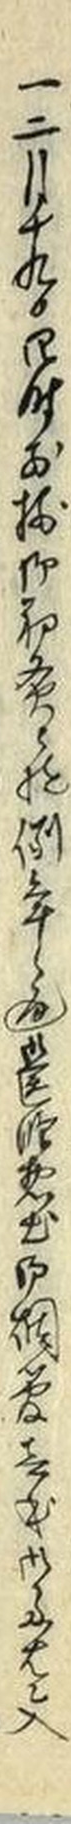一二月十九日四時前揃御初灸被遊例年之通御医師惣出御烟管壱本御たはこ入
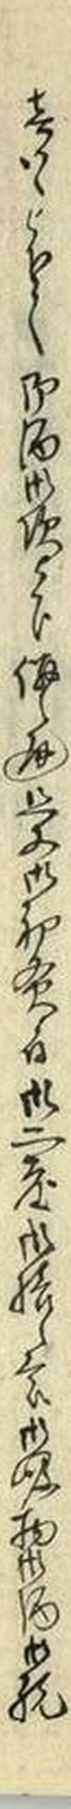壱ツゝ被下之御酒御次被下例之通且又御初灸ニ付御二度御膳之節御吸物御酒御祝
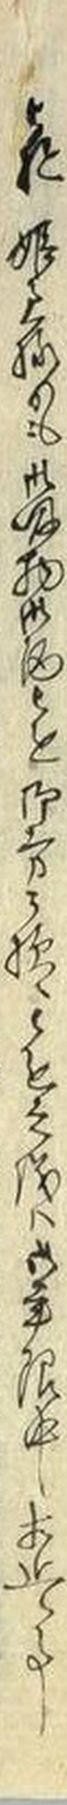被遊姫君様へも御吸物御酒被進御方々様へ被進之儀ハ御年限中相止候事
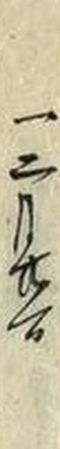一二月廿一日
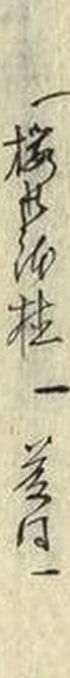桜御鉢植一藤同一
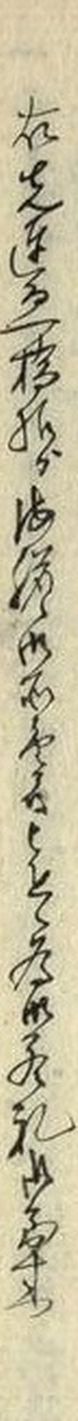右先達而一橋様ゟ海胆御所望ニ付被進候為御答礼御到来
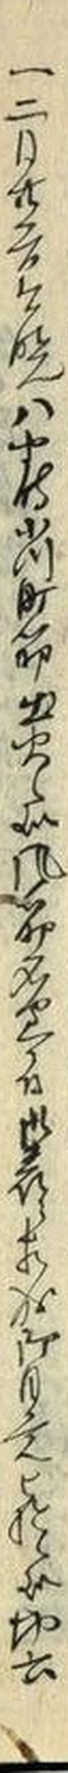一二月廿二日今晩八半時小川町筋出火候処風筋不宣候付御表ニ相成御目覚被遊候処切六
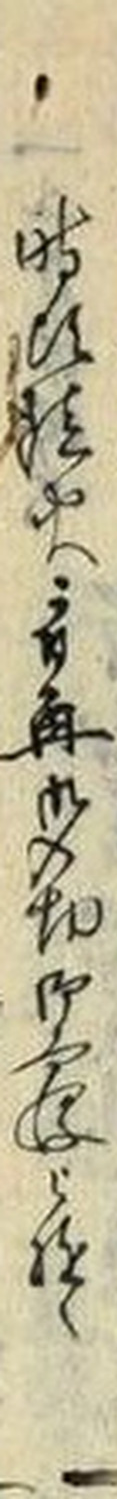時頃鎮火ニ付再御〆切御寝被遊候
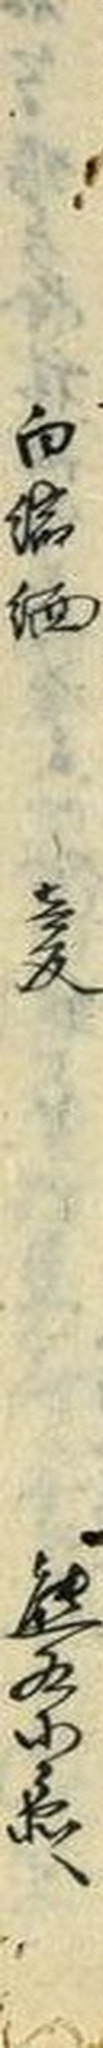白縮緬壱反熊谷小兵衛へ
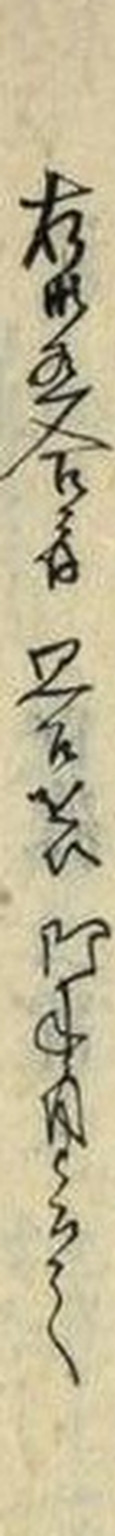右御有合ニ付思召を以御手自被下之

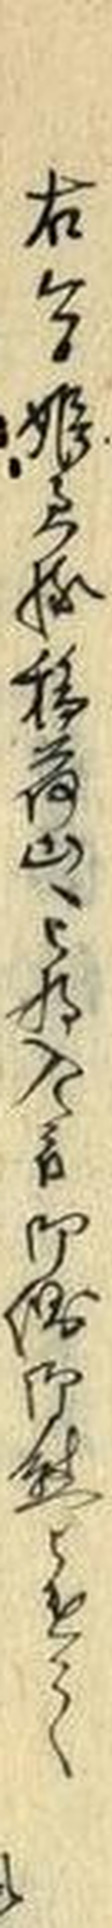右今日姫君様稲荷山へ被為入候ニ付御側御慰被進之
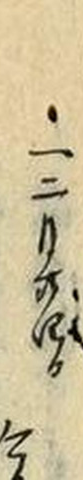一二月廿四日
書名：少傅日録抄（斉承付側向頭取日記、在府）
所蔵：福井県文書館 Fukui Prefectural Archives
